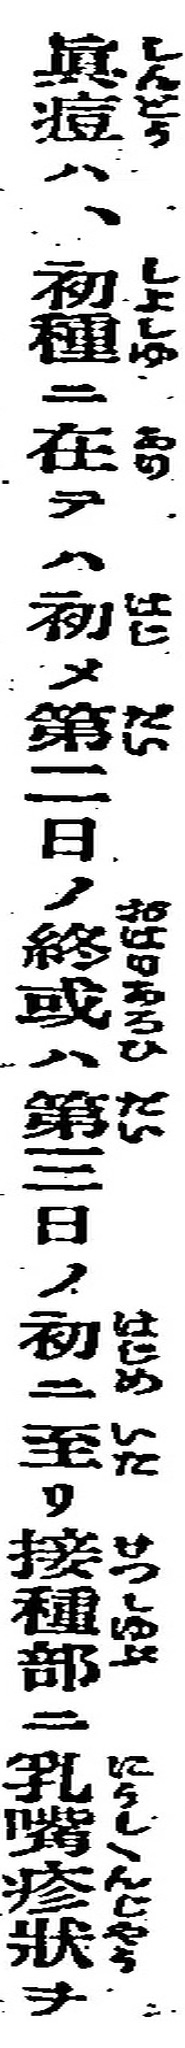真痘ハ、初種ニ在テハ初メ第二日ノ終或ハ第三日ノ初ニ至リ接種部ニ乳嘴疹状ヲ
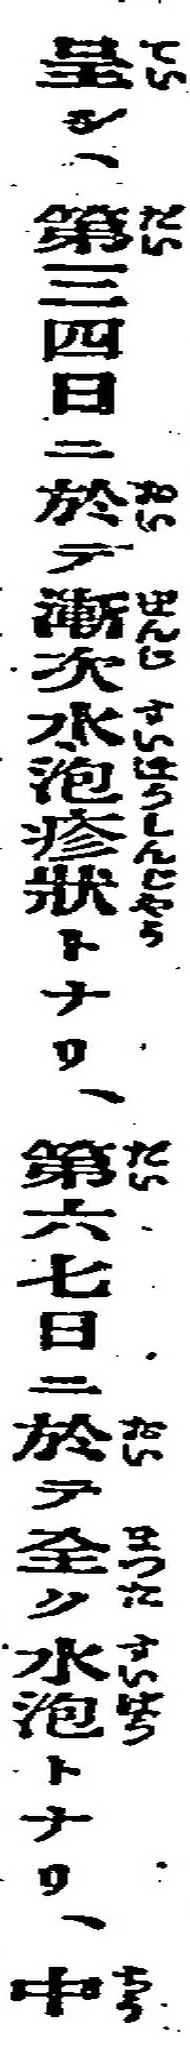呈シ、第三四日ニ於テ漸次水泡疹状トナリ、第六七日ニ於テ全ク水泡トナリ、中
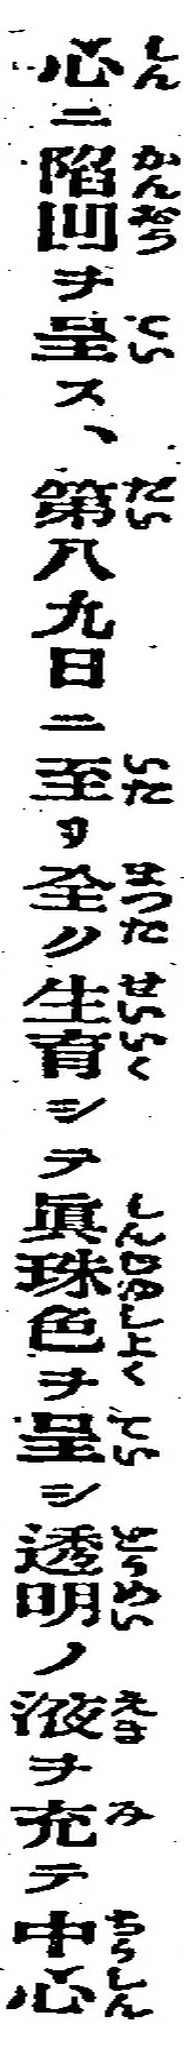心ニ陥凹ヲ呈ス、第八九日ニ至リ全ク生育シテ真珠色ヲ呈シ透明ノ液ヲ充テ中心
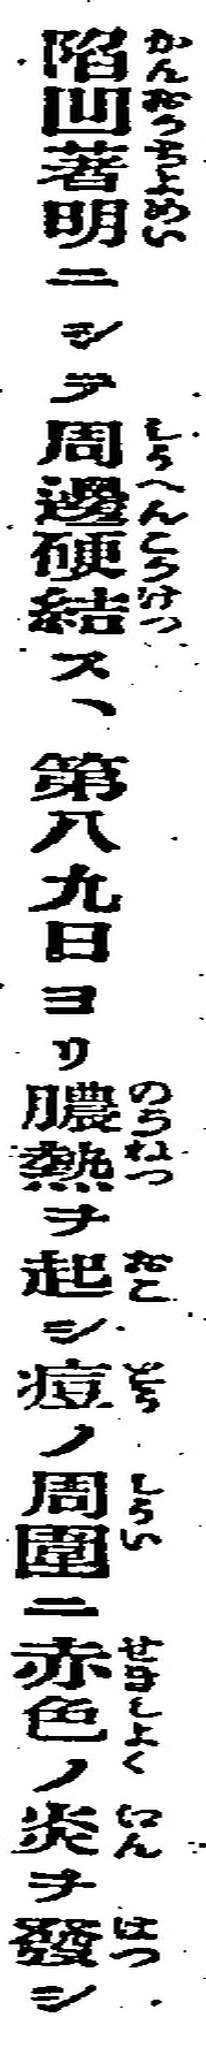陥凹著明ニシテ周辺硬結ス、第八九日ヨリ膿熱ヲ起シ痘ノ周囲ニ赤色ノ炎ヲ発シ
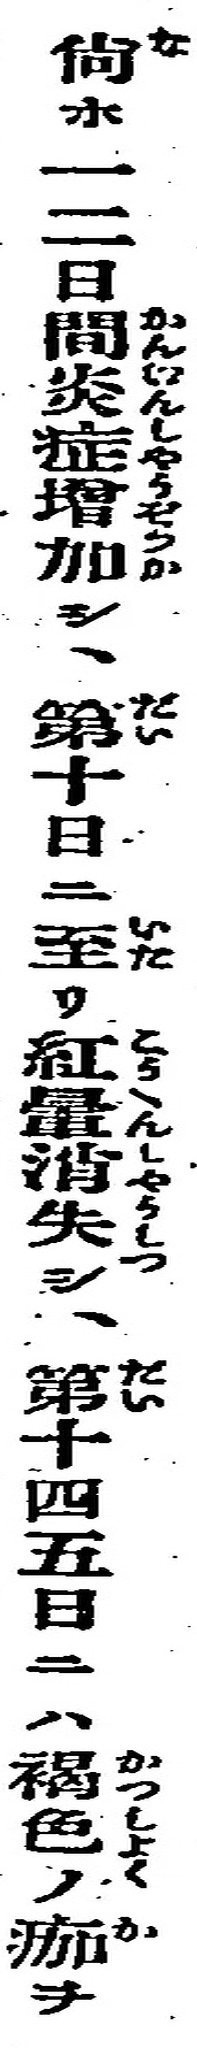尚ホ一二日間炎症増加シ、第十日ニ至リ紅暈消失シ、第十四五日ニハ褐色ノ痂ヲ
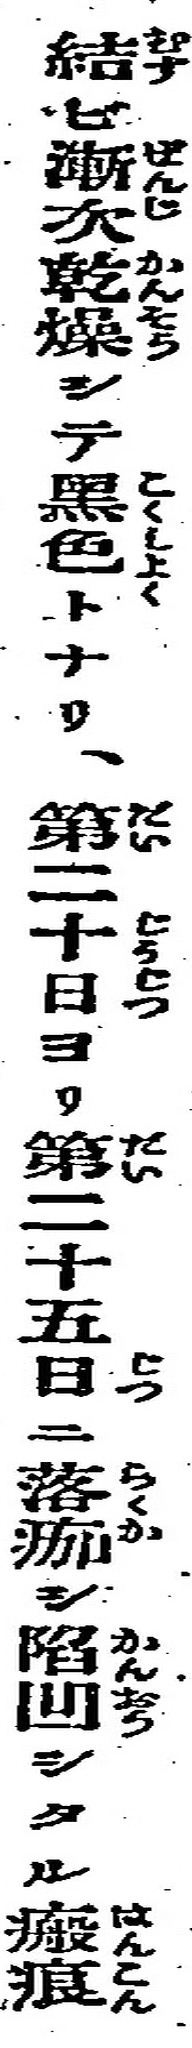結ビ漸次乾燥シテ黒色トナリ、第二十日ヨリ第二十五日ニ落痂シ陥凹シタル瘢痕
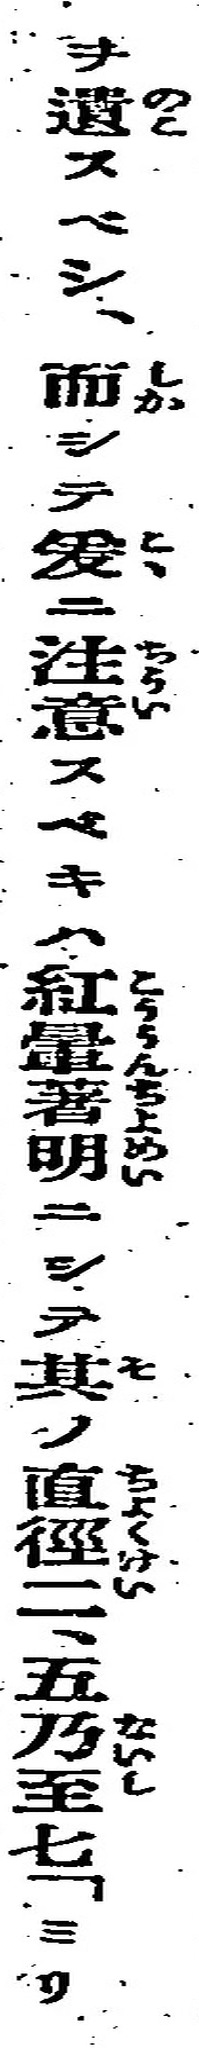ヲ遺スベシ、而シテ爰ニ注意スベキハ紅暈著明ニシテ其ノ直径二、五乃至七「ミリ
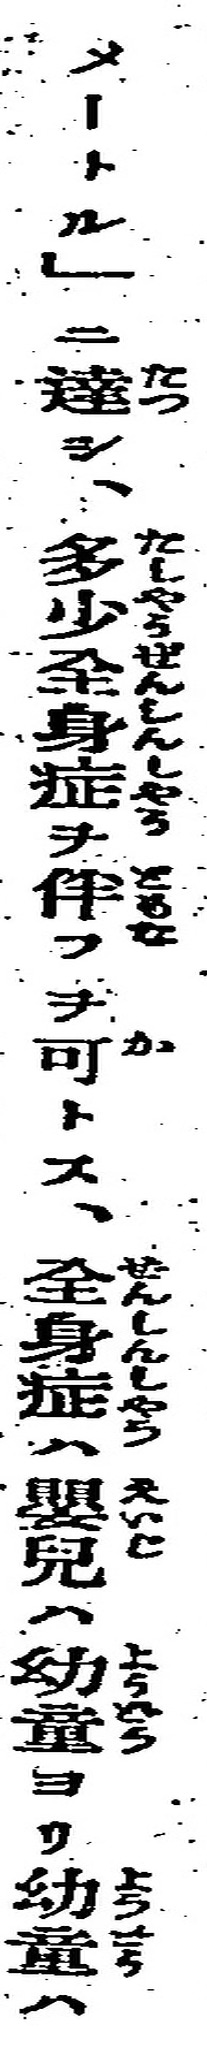メートル」ニ達シ、多少全身症ヲ伴フヲ可トス、全身症ハ嬰児ハ幼童ヨリ幼童ハ

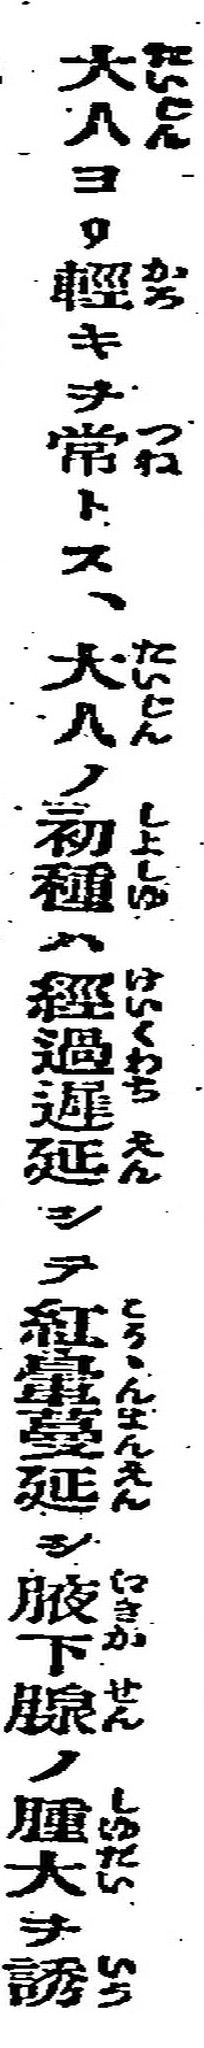大人ヨリ軽キヲ常トス、大人ノ初種ハ経過遅延シテ紅暈蔓延シ腋下腺ノ腫大ヲ誘
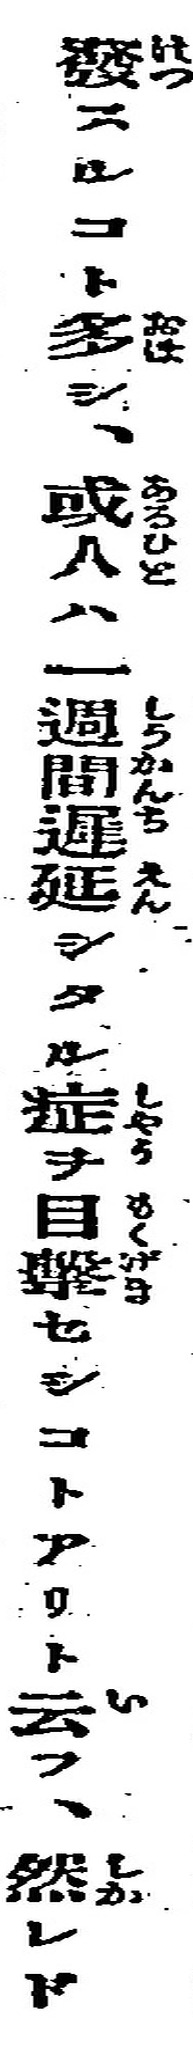発スルコト多シ、或人ハ一週間遅延シタル症ヲ目撃セシコトアリト云フ、然レド
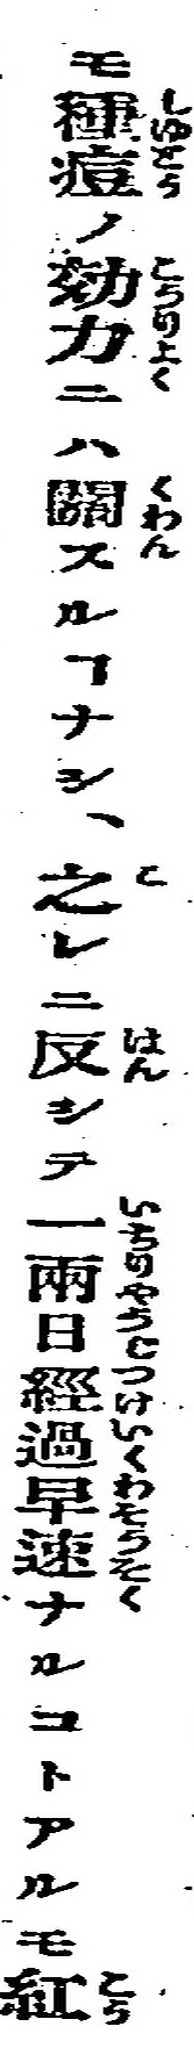モ種痘ノ効力ニハ関するヿナシ、之レニ反シテ一両日経過早速ナルコトアルモ紅
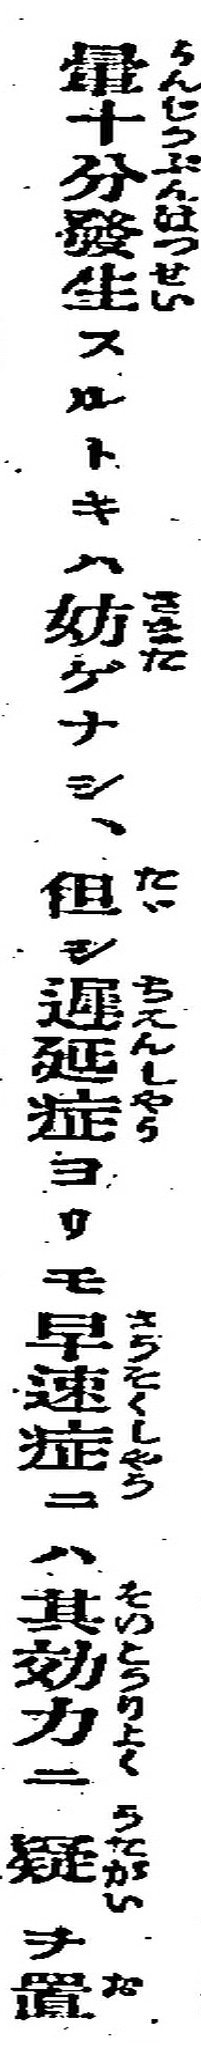暈十分発生スルトキハ妨ゲナシ、但シ遅延症ヨリモ早速症ニハ其効力ニ疑ヲ置
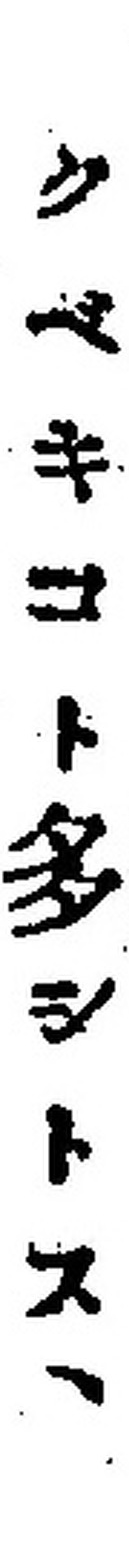クベキコト多シトス、
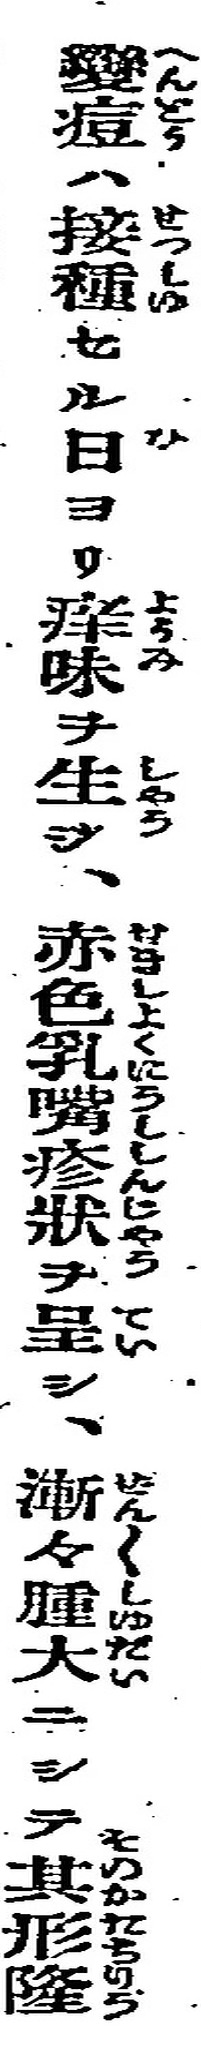変痘ハ接種セル日ヨリ痒味ヲ生ジ、赤色乳嘴疹状ヲ呈シ、漸々腫大ニシテ其形隆
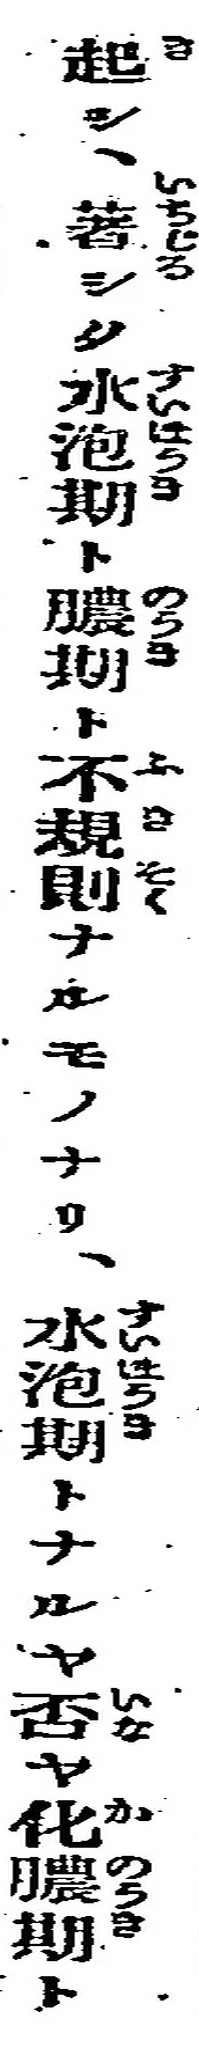起シ、著シク水泡期ト膿期ト不規則ナルモノナリ、水泡期トナルヤ否ヤ化膿期ト
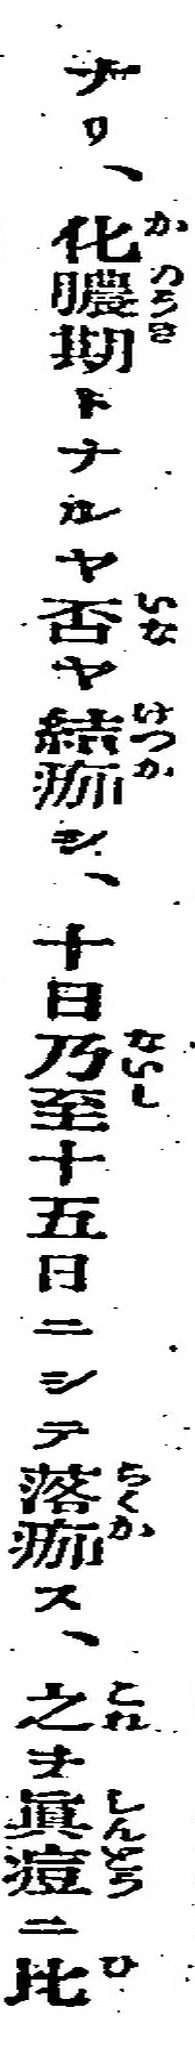ナリ、化膿期トナルヤ否ヤ結痂シ、十日乃至十五日ニシテ落痂ス、之ヲ真痘ニ比
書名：天然痘予防注意兼種痘者之注意
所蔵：国立国会図書館 National Diet Library, JAPAN
